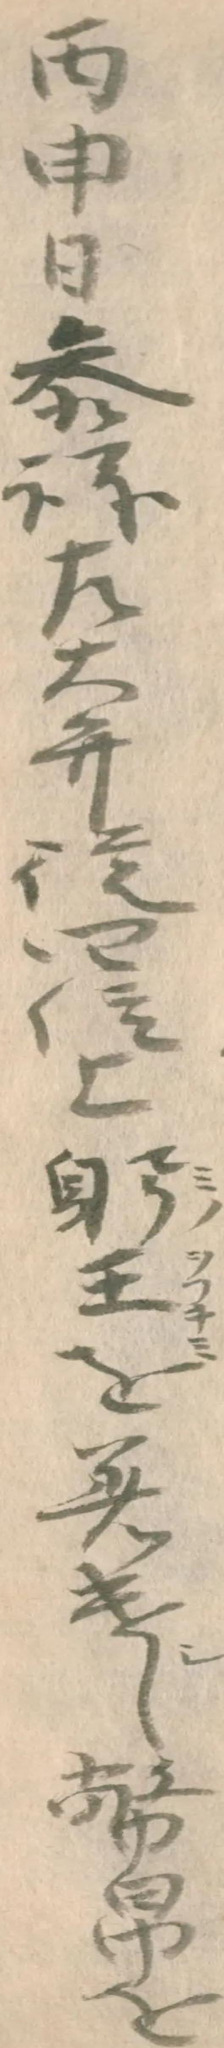丙申日参議左大弁従四位上躬王を差遣幣帛を
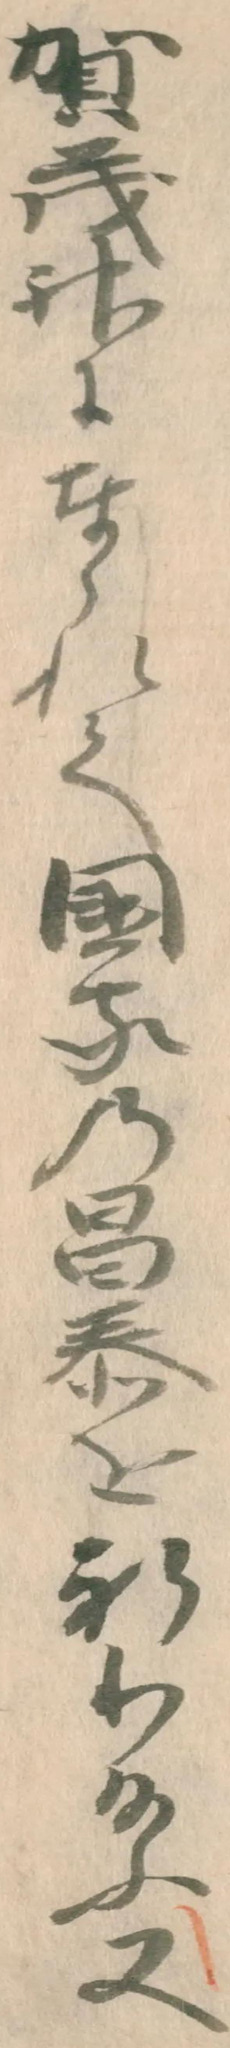賀茂神に奉られて国家の昌泰を祈り給ふ又
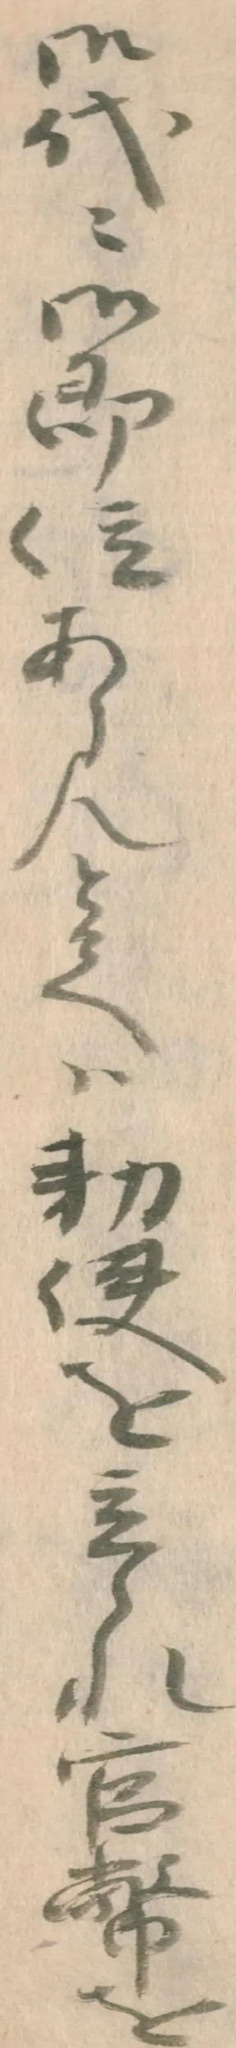御代々御即位あらんとては勅使を立られ官幣を
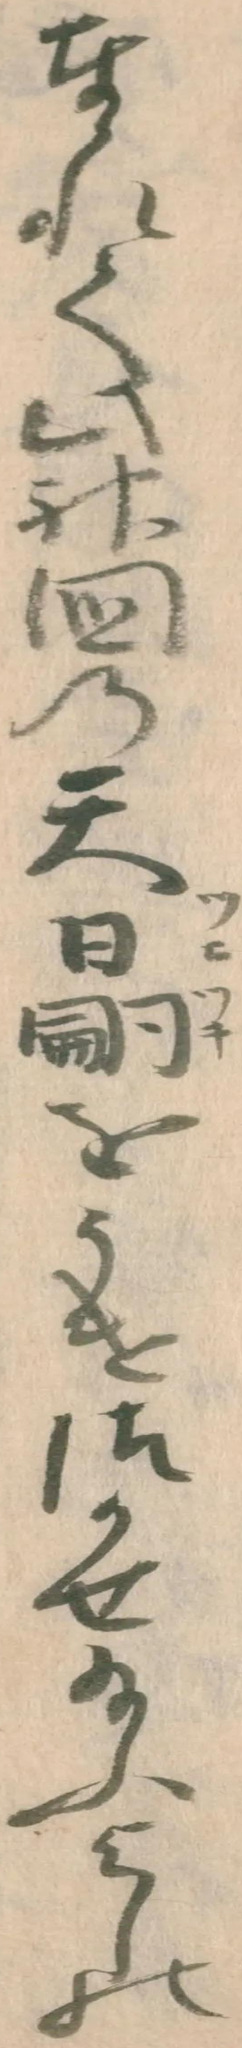奉られて此神国の天日嗣をうけつかせ給ふよしの
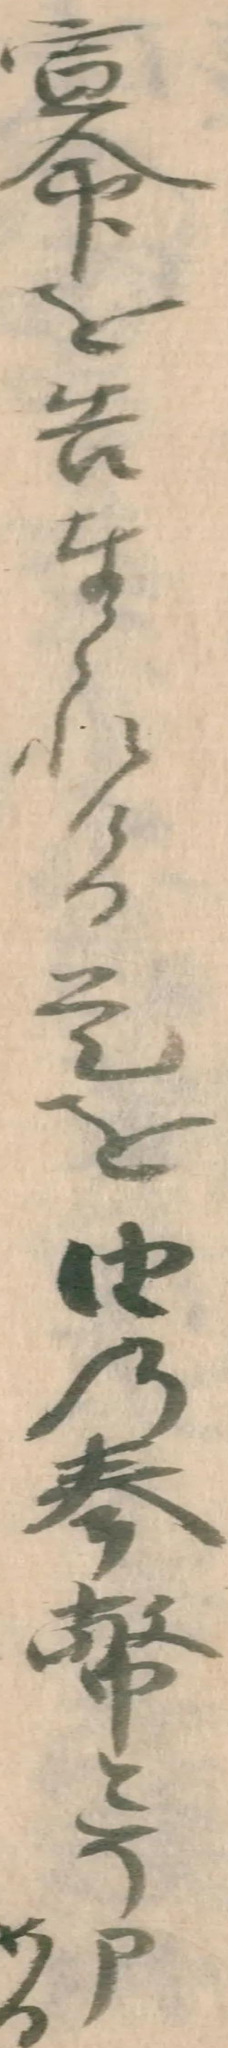宣命を告奉られける是を由の奉幣とそ申める
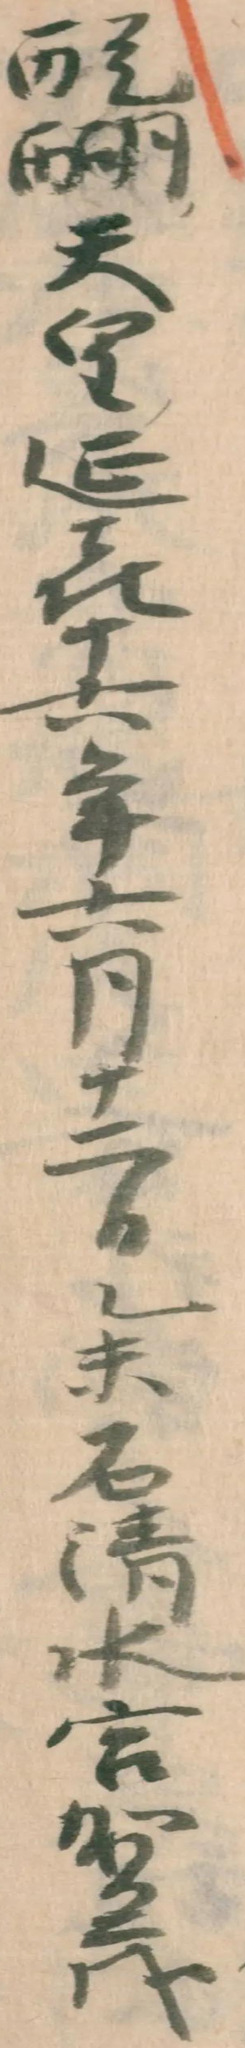醍醐天皇延喜十六年六月十二日乙末石清水宮賀茂
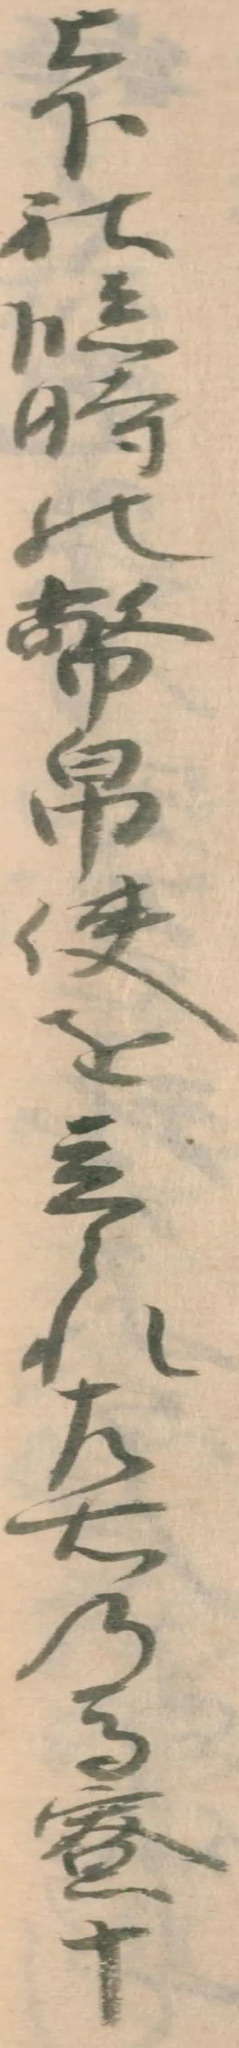上下社臨時の幣帛使を立られ左右の馬寮十
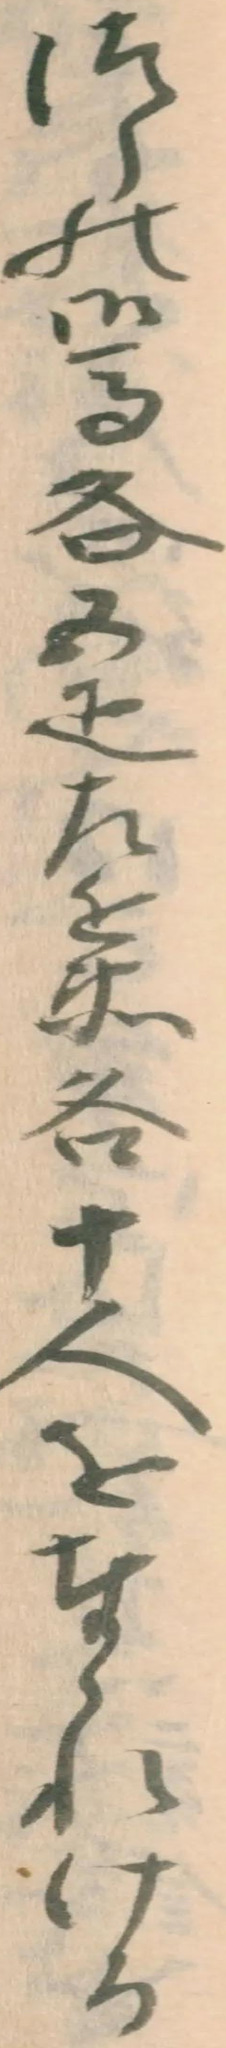つらの御馬各五疋左近衛各十人を奉られける
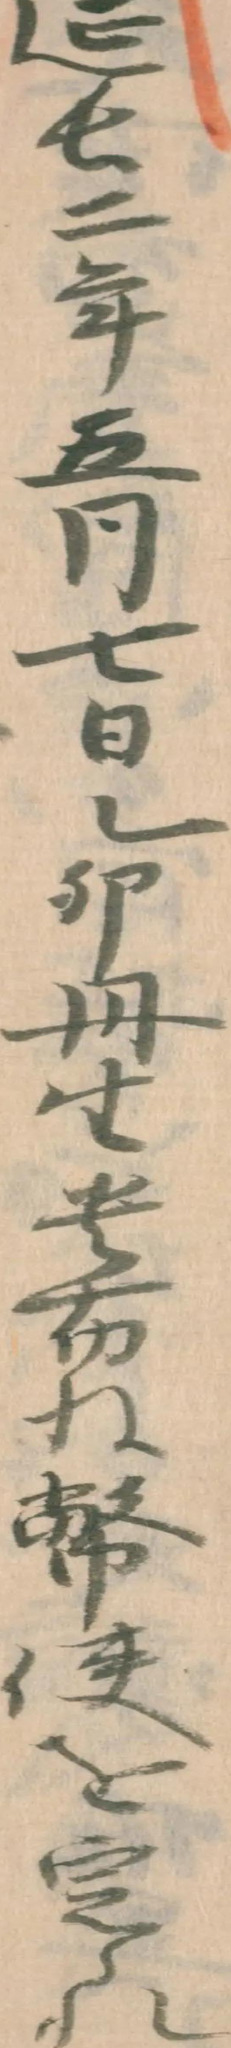延長二年五月七日乙卯丹生貴ふね幣使を定られ
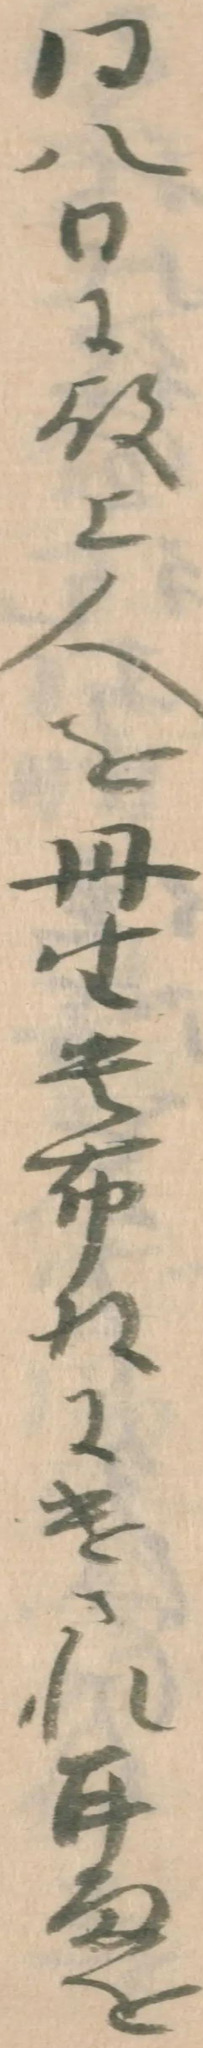同八日に殿上人を丹生貴ふねに遣され甘雨を
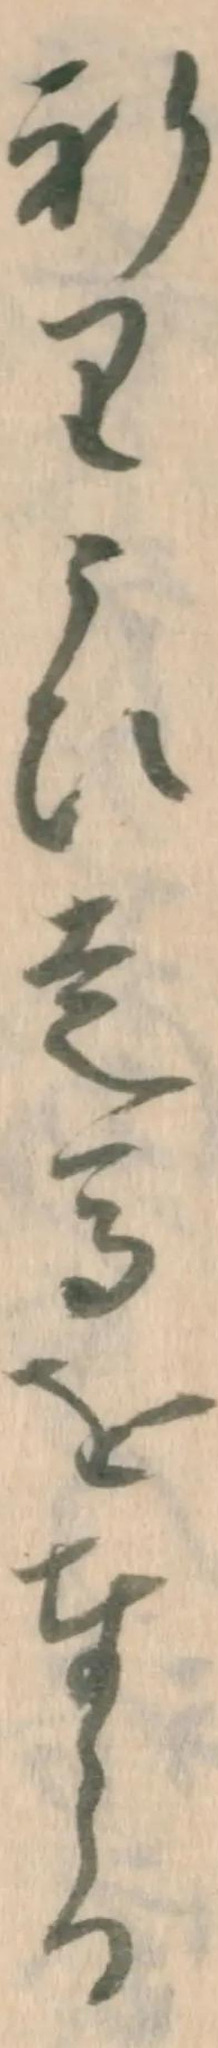祈りこひ走馬を奉らる
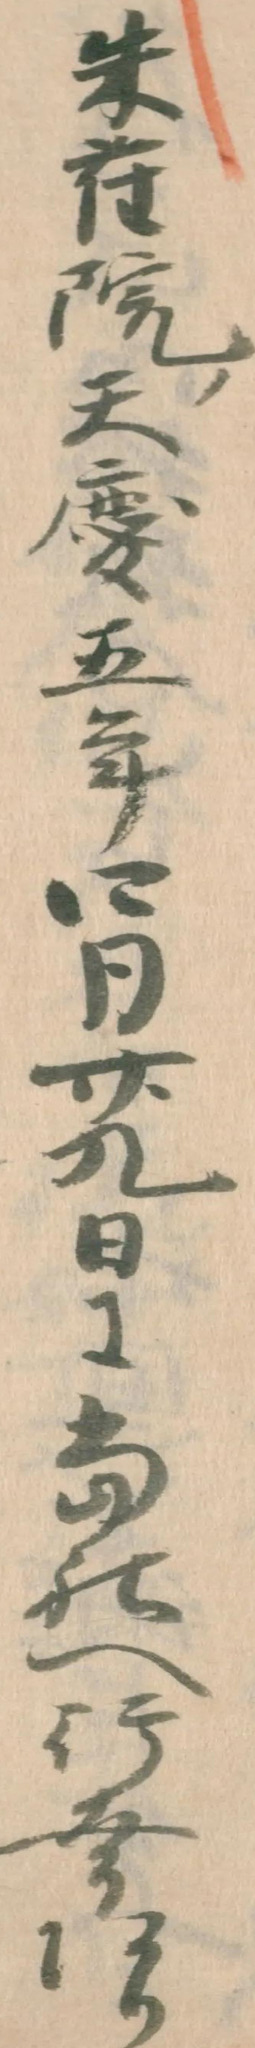朱雀院天慶五年四月廿九日に当社へ行幸あり
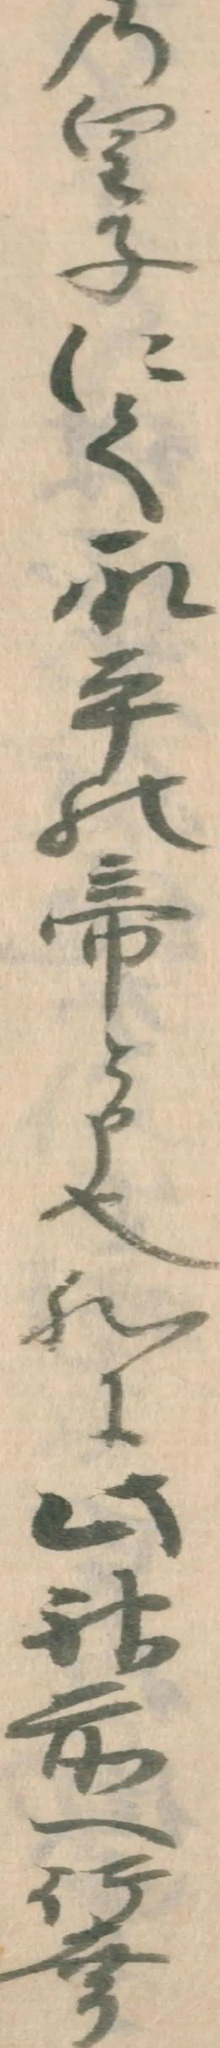の皇子にて承平の帝と申也然に此神前へ行幸
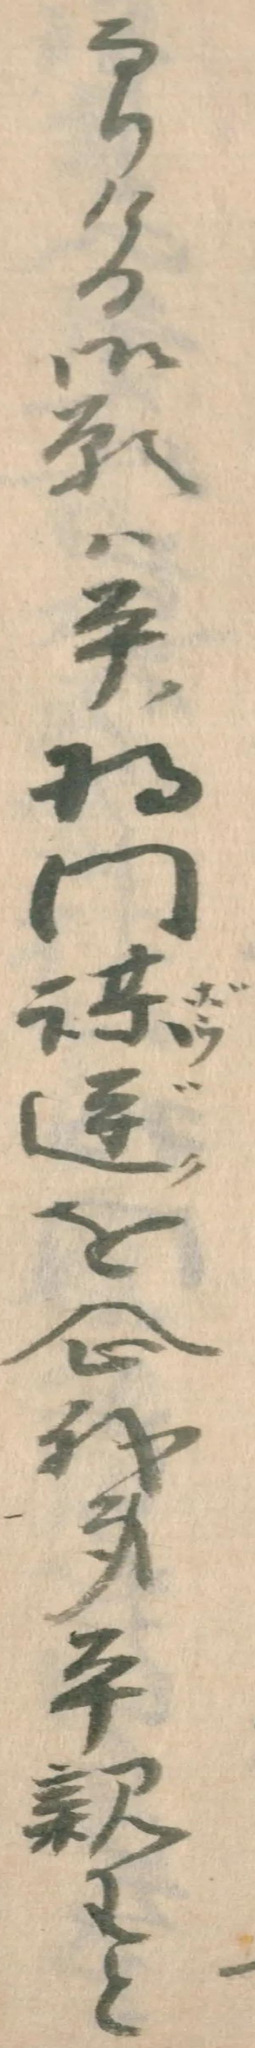なりける御願は平将門謀逆を企我身平親王と
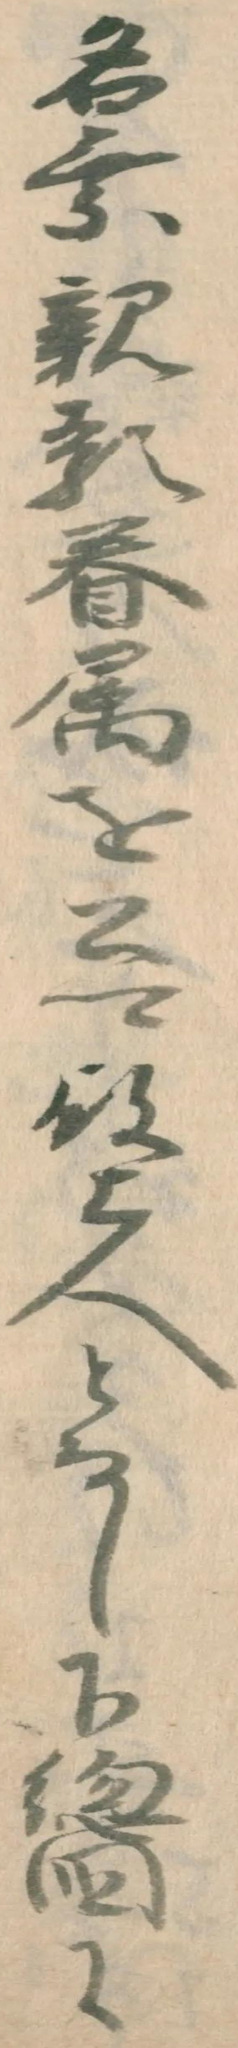名乗親類眷属を公卿殿上人となし下総国に
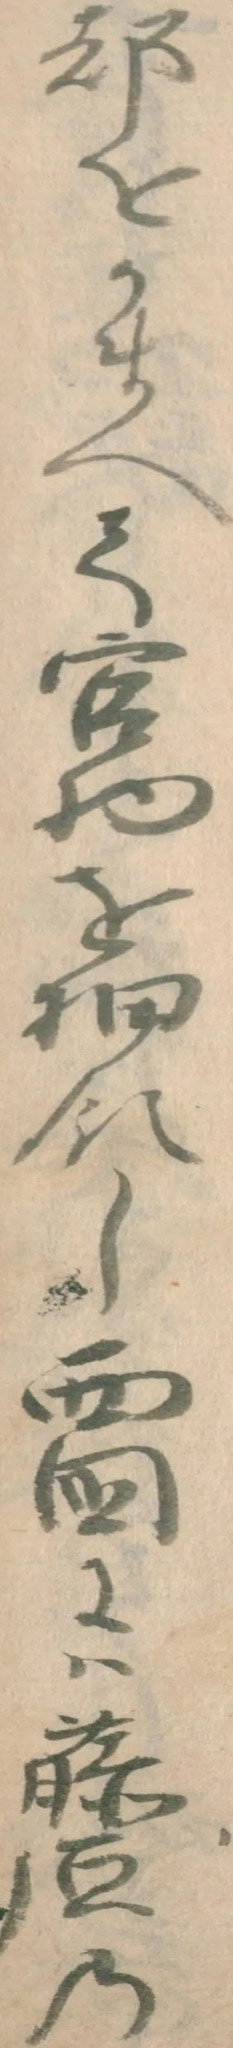都をかまへて官物を押領し西国には藤原の
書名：賀茂社記録. 第1冊
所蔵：国立国会図書館 National Diet Library, JAPAN
